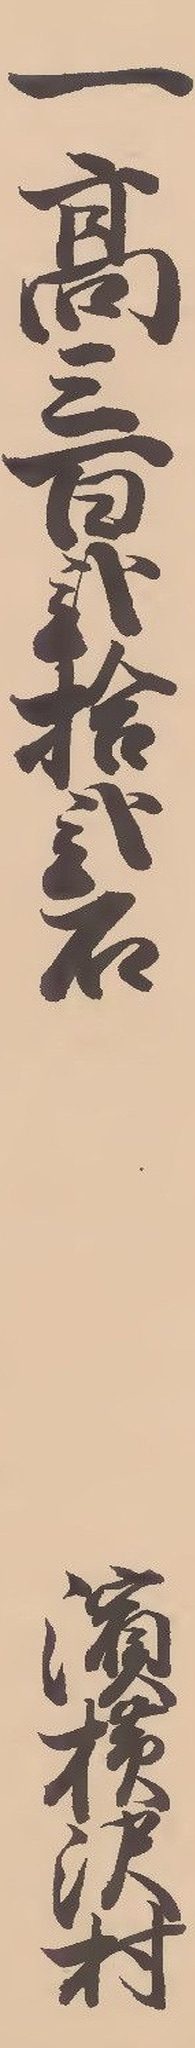一高三百弐拾弐石浜横沢村
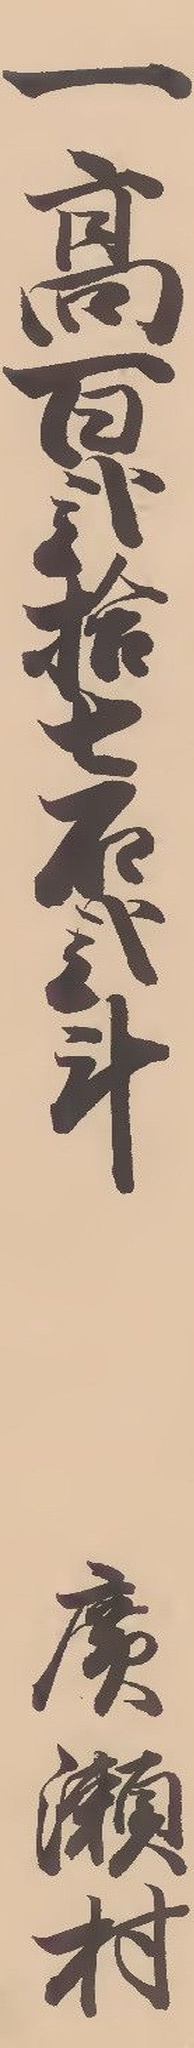一高百弐拾七石弐斗広瀬村

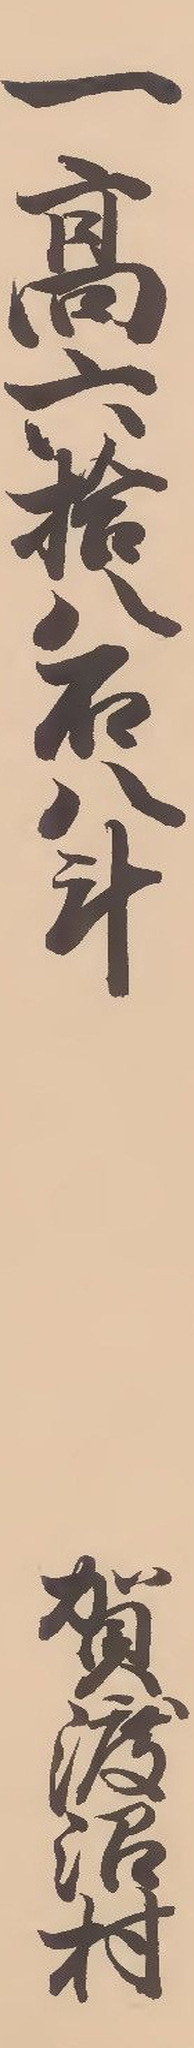一高六拾八石八斗賀渡沼村
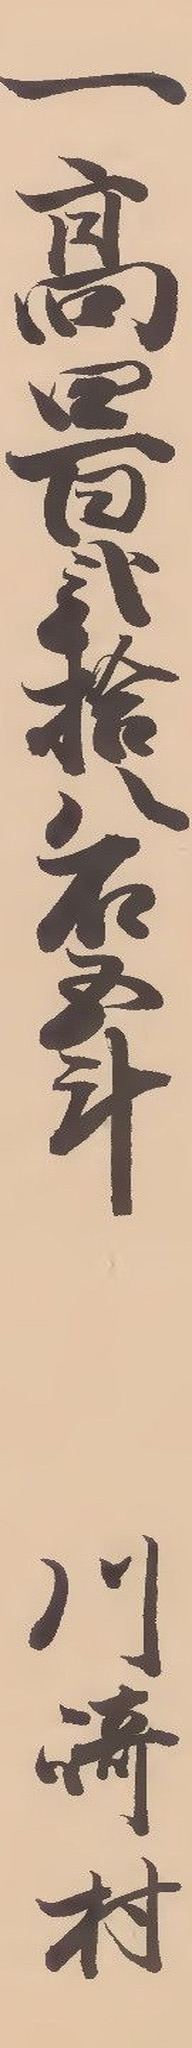一高四百弐拾八石五斗川崎村
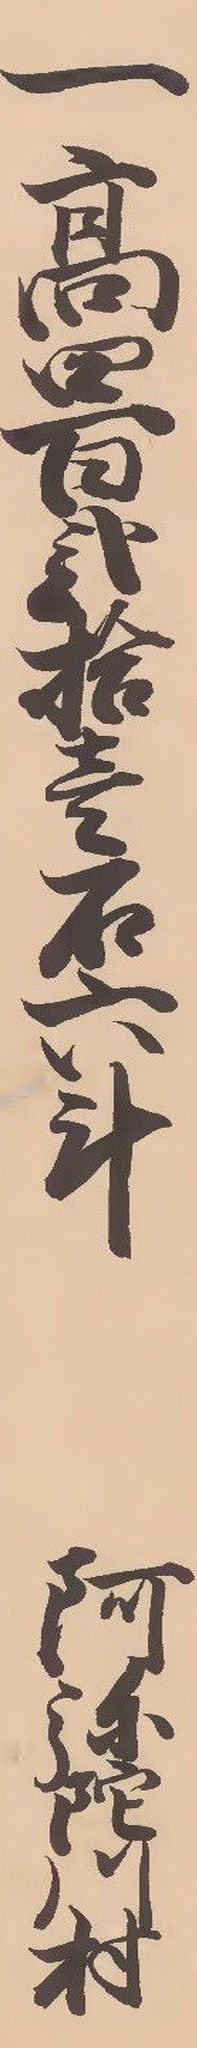一高四百弐拾壱石六斗阿弥陀川村
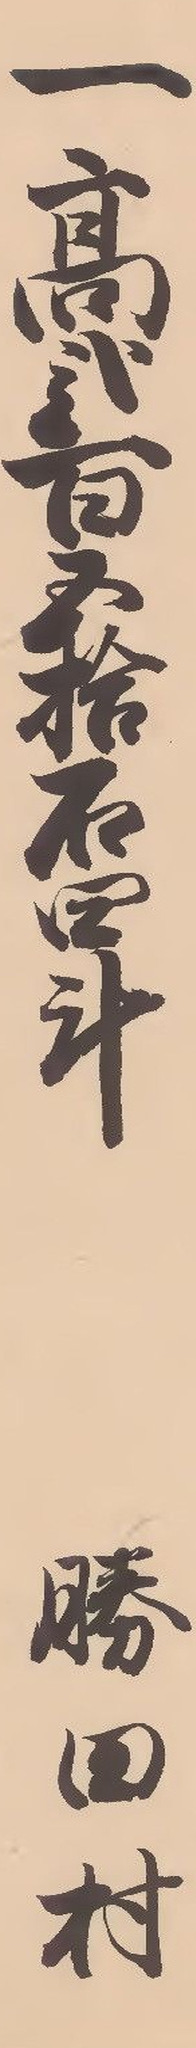一高弐百五拾石四斗勝田村
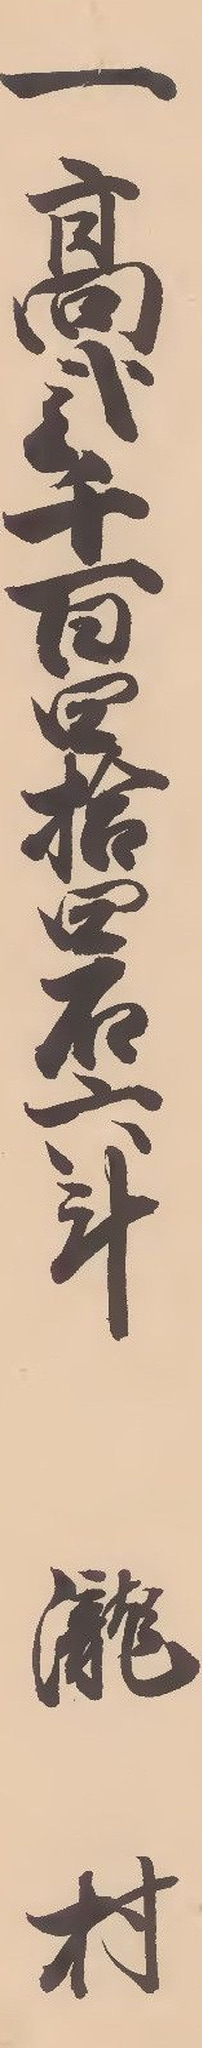一高弐千百四拾四石六斗滝村

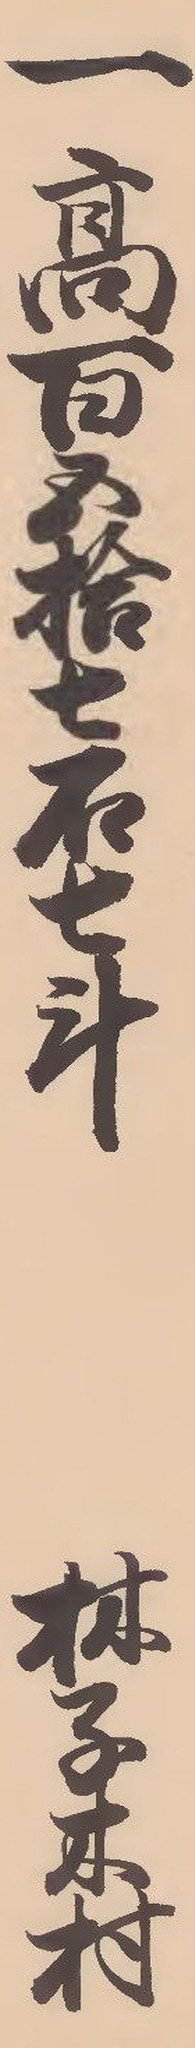一高百五拾七石七斗林子木村
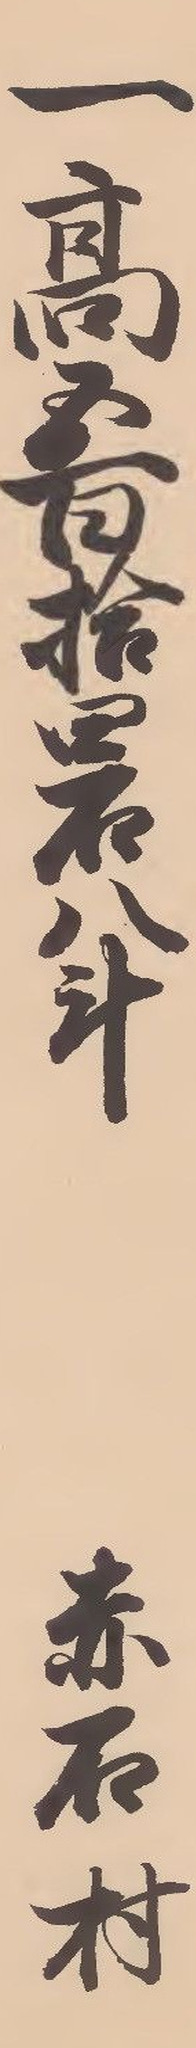一高五百拾四石八斗赤石村
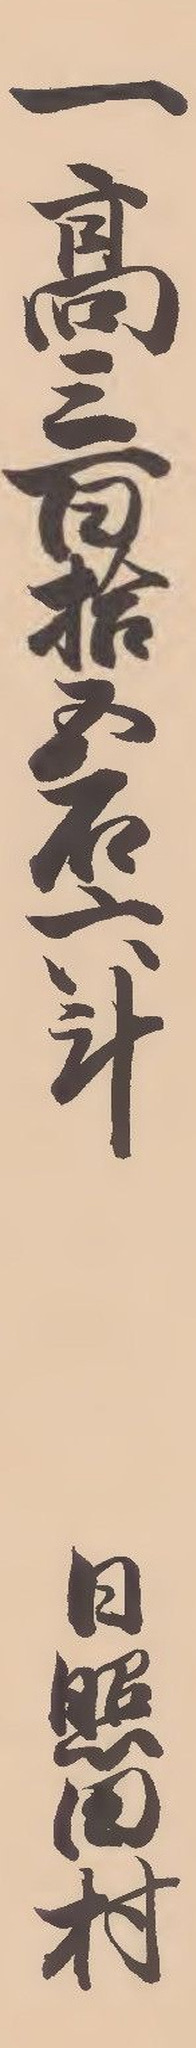一高三百拾五石六斗日照田村
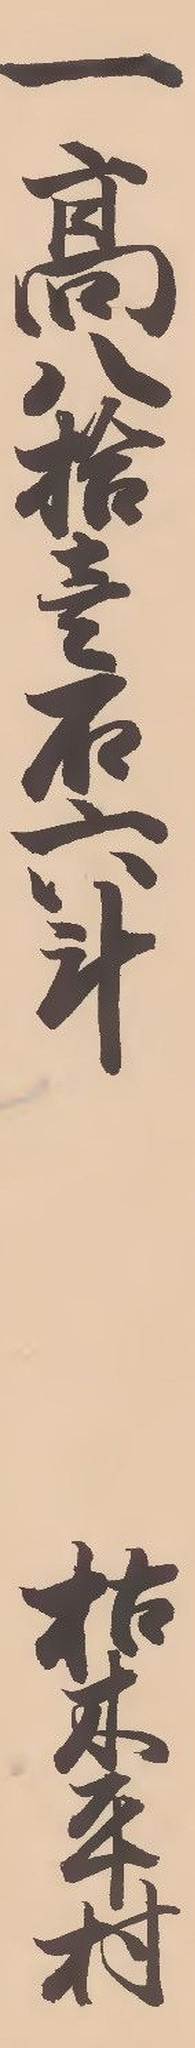一高八拾壱石六斗枯木平村
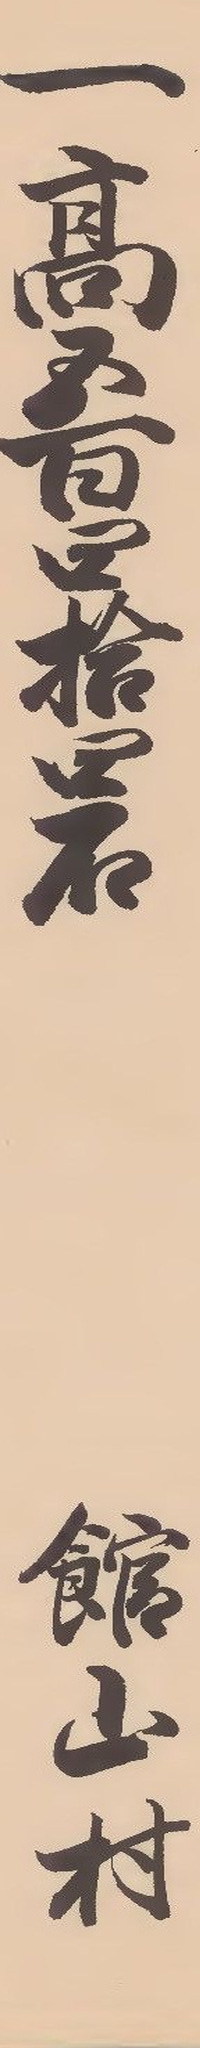一高五四拾四石館山村
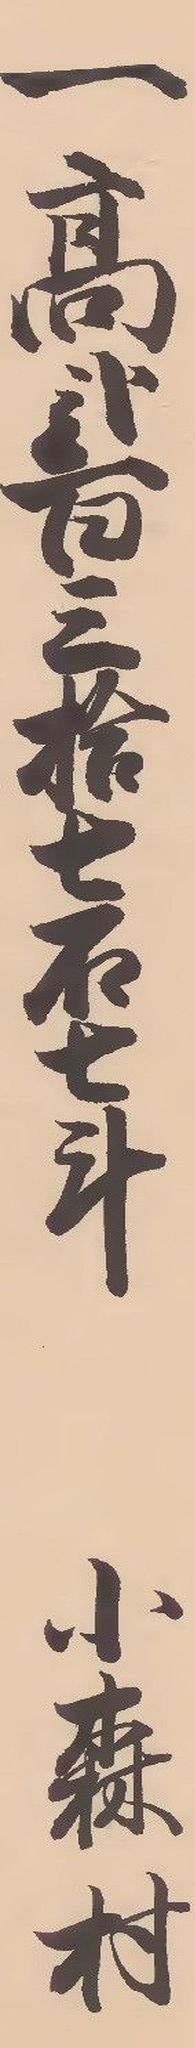一高弐百三拾七石七斗小森村

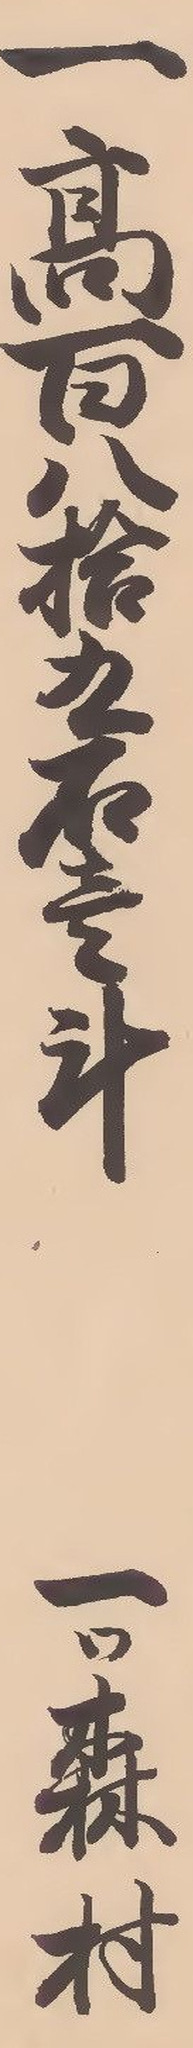一高百八拾九石壱斗一ツ森村
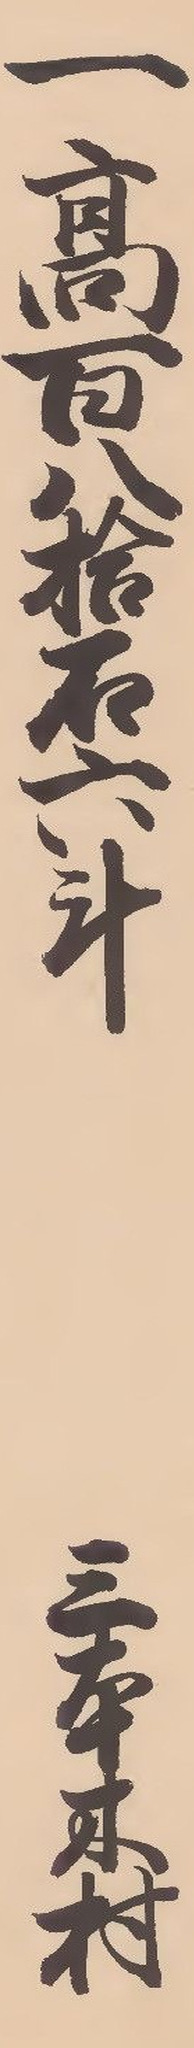一高百八拾石六斗三本木村
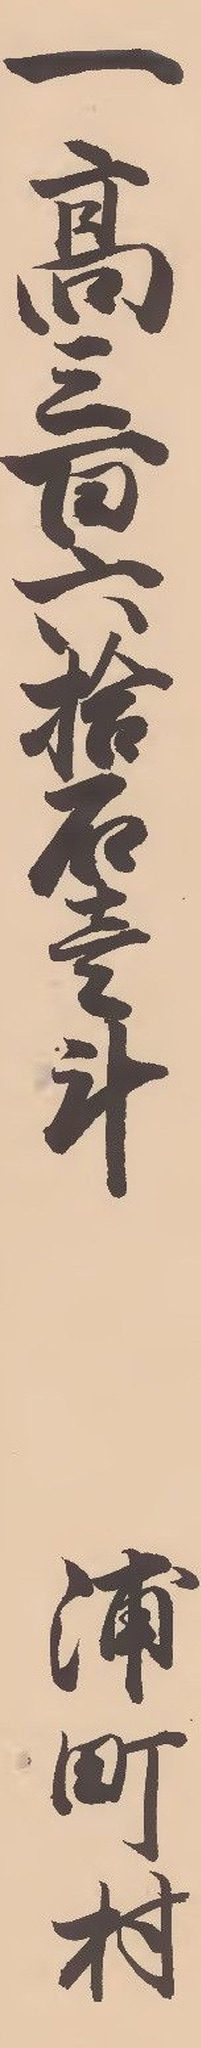一高三百六拾石壱斗浦町村
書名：陸奥国郷帳　７
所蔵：国立公文書館 National Archives of Japan
